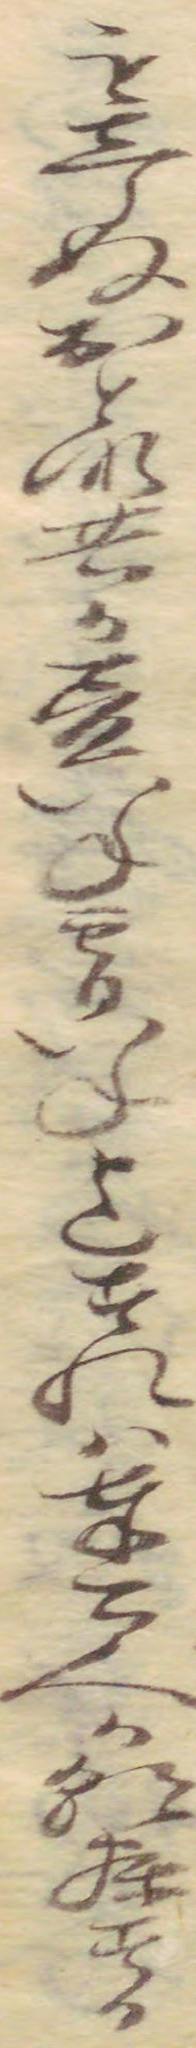もしらぬおとな共か昼いね宵いね迄すれは奉公人か朝寝する

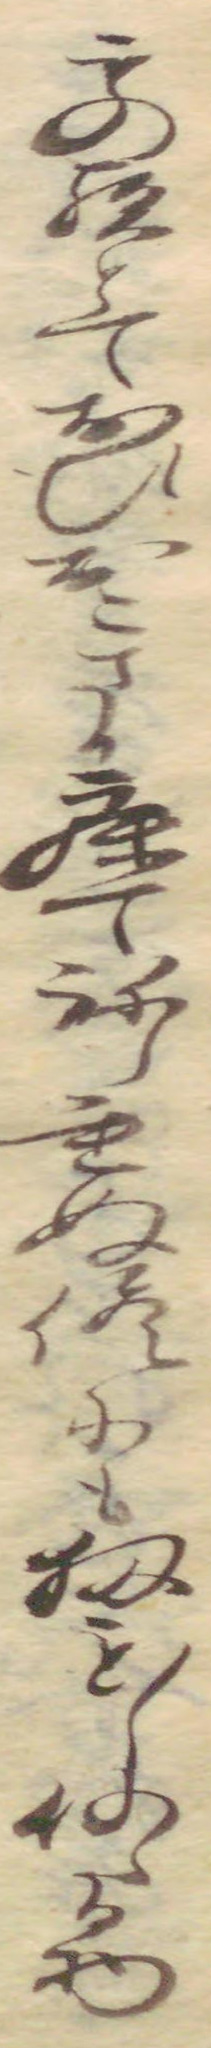もの歟とておひおこさる寝てねられぬ侭にも扨も〳〵何たる物
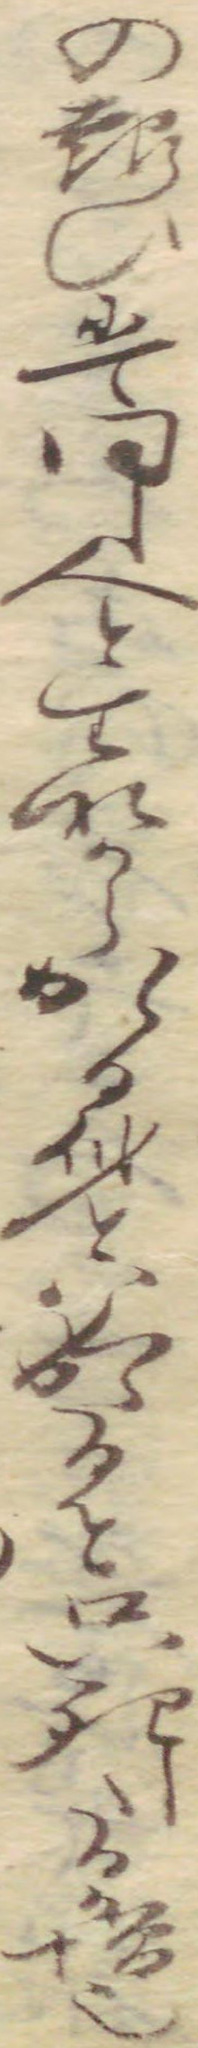の報ひにて同し人とてなからかゝる身とは成たるそ只死したるか増也
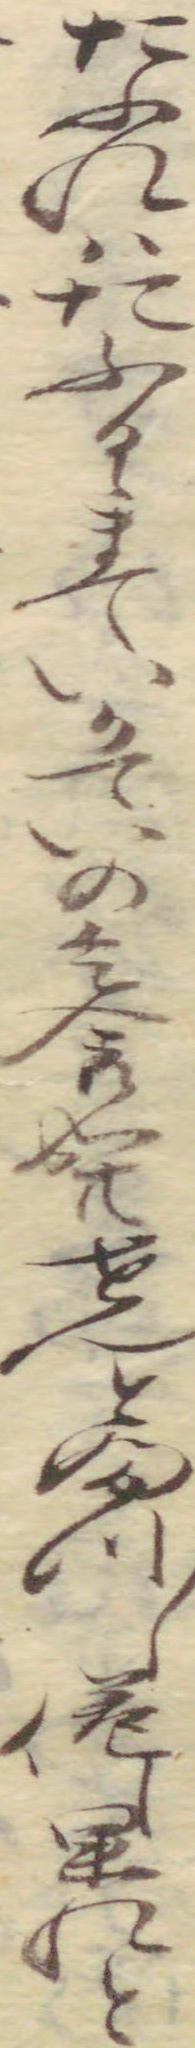たふれはたふるゝまていかていの乞食成共せんとふつ〳〵倦し果れと
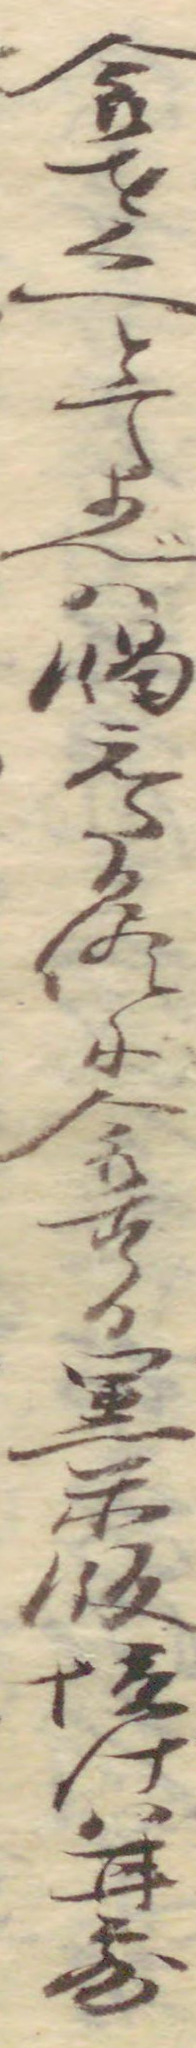食をくへとてよべは餲えたる侭に食する黒米飯塩汁は甘露
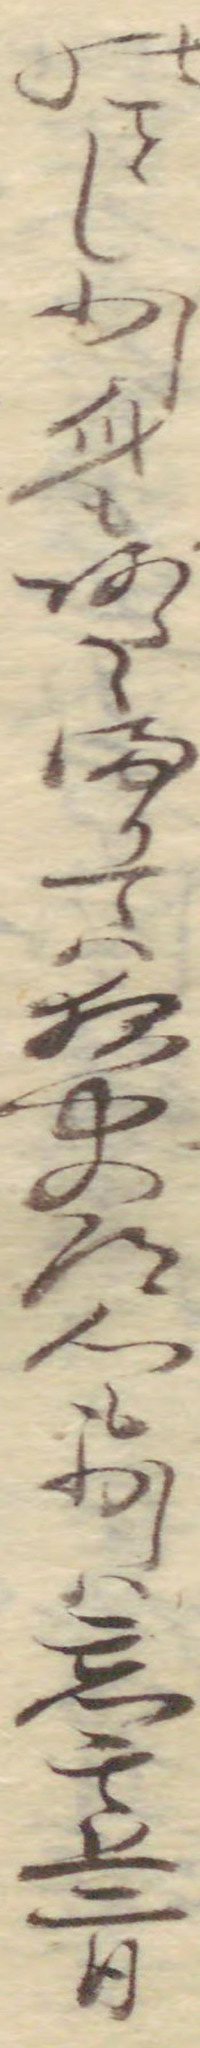のことし少し身もあたゝまりては夜中の道心も少しは忘其上二月
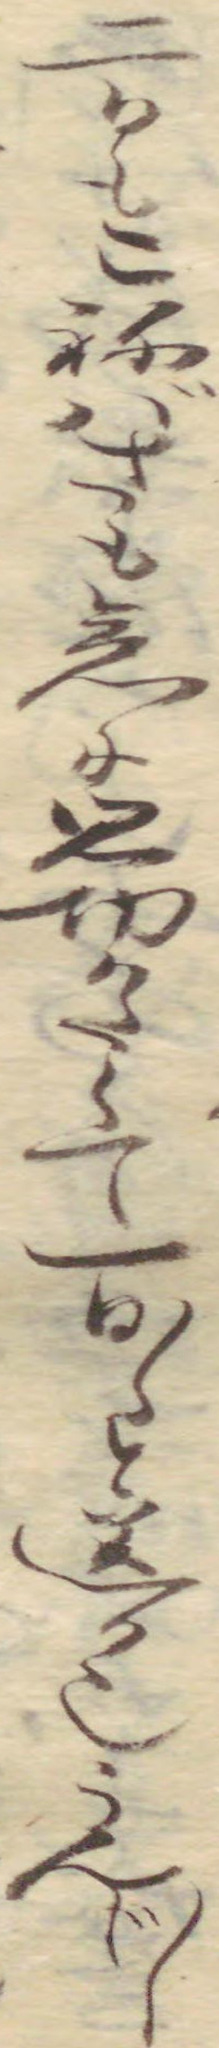二日もこねばさも急に思切かたくて一日〳〵と送る也うんじ〳〵
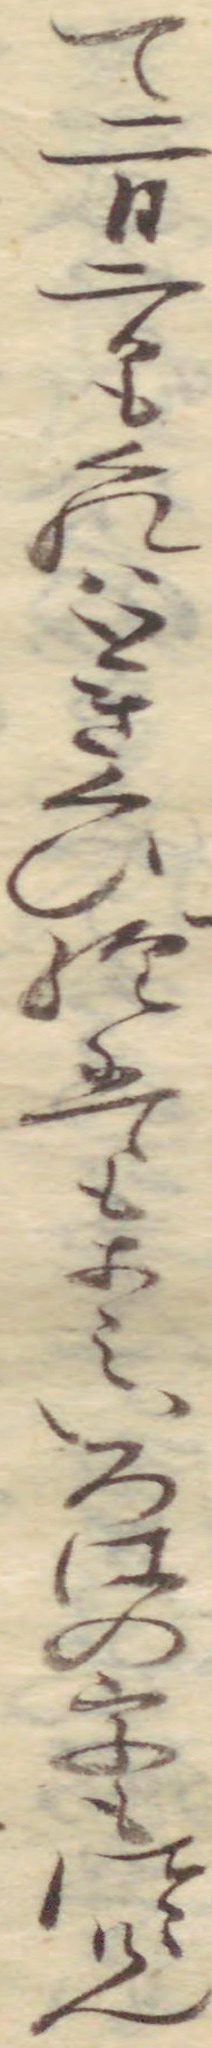て二月二日もくれはときくひ経にてもよみいろはの字もつゝけん
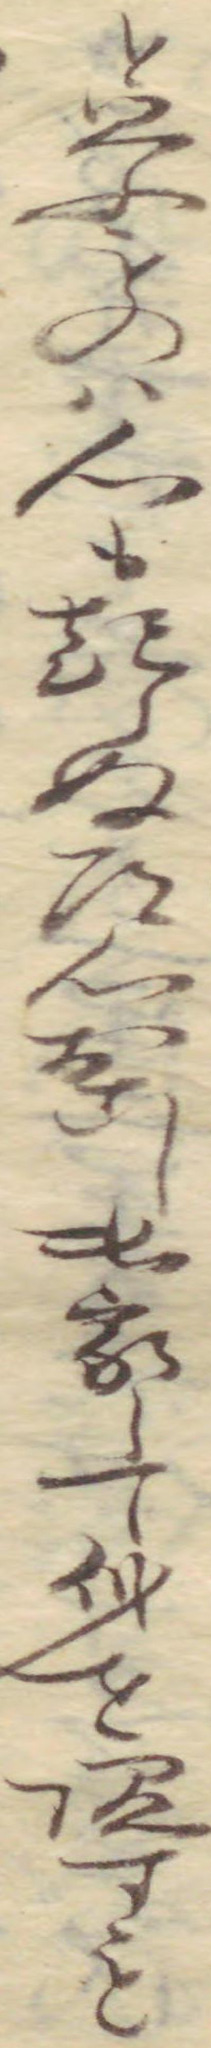と思ふものは心も起らぬ道心おこし出家して身を隠すも
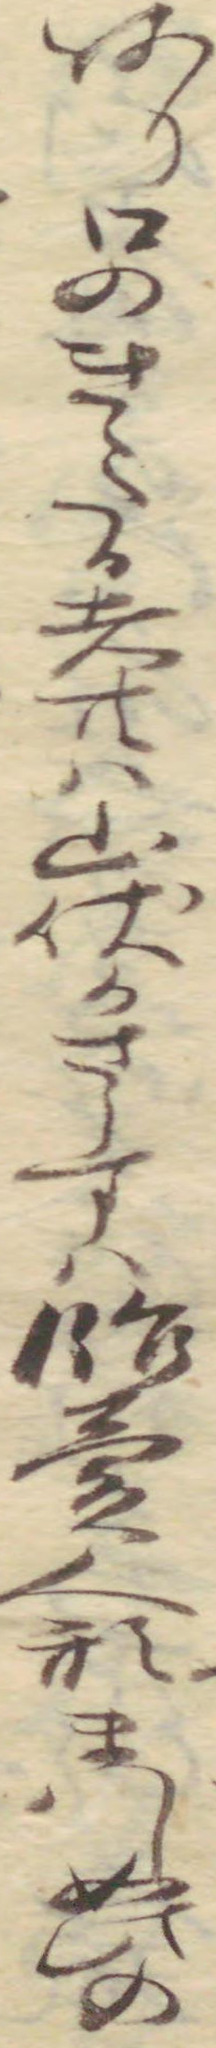あり口のきゝたる者共は山伏かさうすは飴売人形まわし如此の
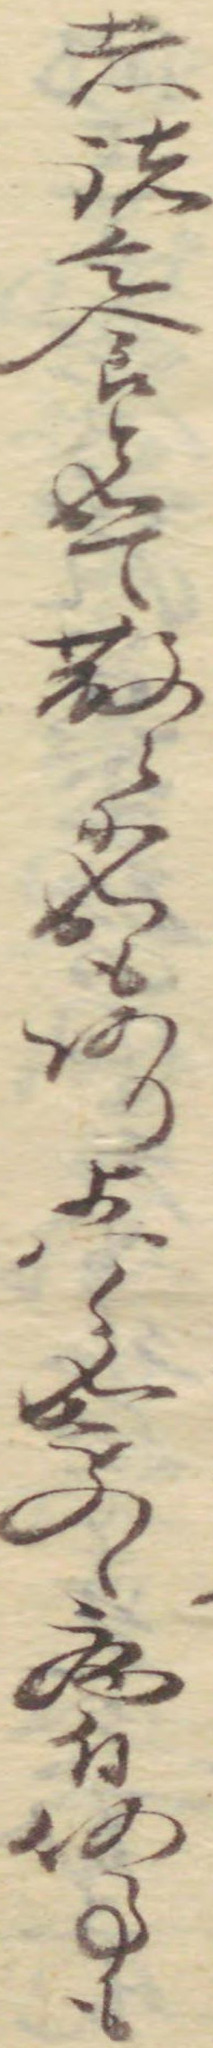者諸乞食と成て散〻に成もありよはく成ものゝ病付何事も
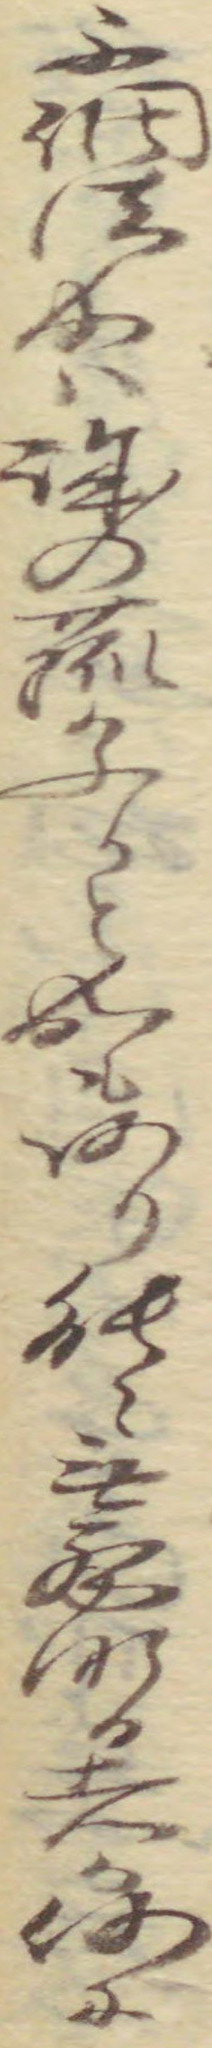不調法成は誠の菰かふりと成もあり能〻無病なる者か何に
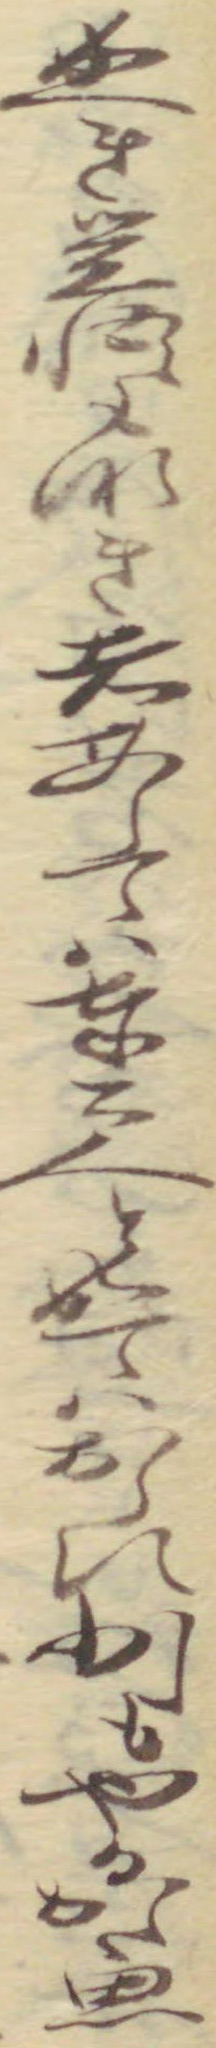成へき覚悟もなき者ならては奉公人と成てはおらす少しもやるかた思
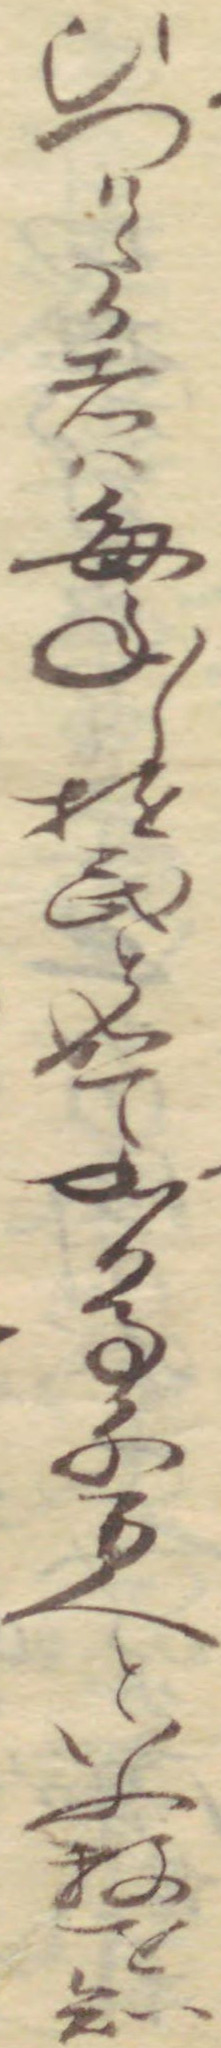ひつけたる者は毎年〳〵遊民と成て出る事千万人といふ数を知
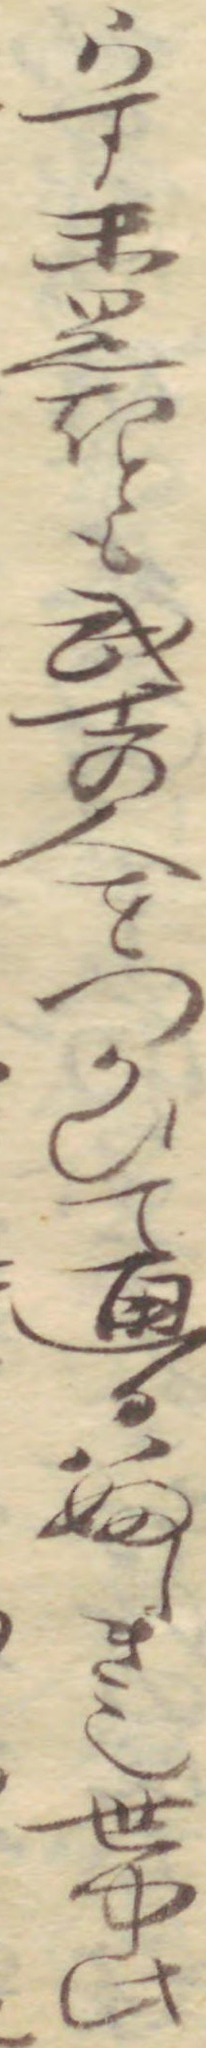らす未是ほとも武士の人をつかひて通るはふしき也世中此
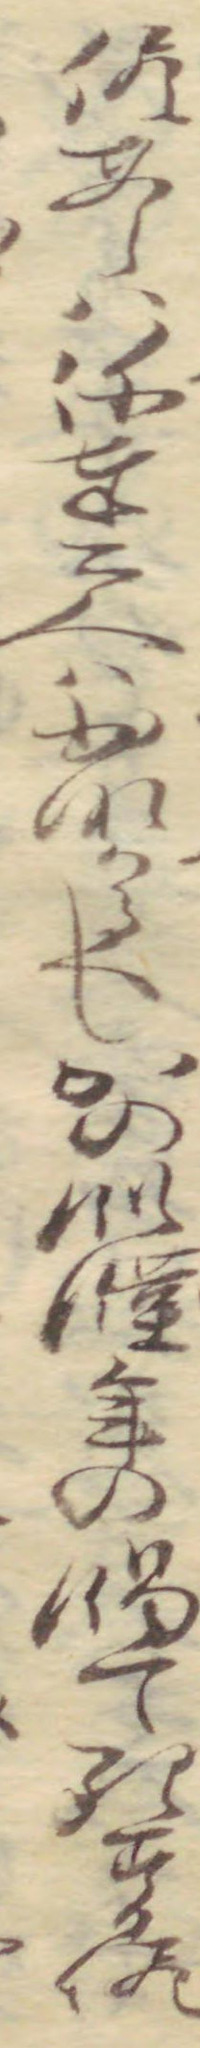侭ならは弥奉公人は少なかるへしかの飢饉年の餲て死する侭
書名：鶯宿雑記. 巻263-264
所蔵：国立国会図書館 National Diet Library, JAPAN
